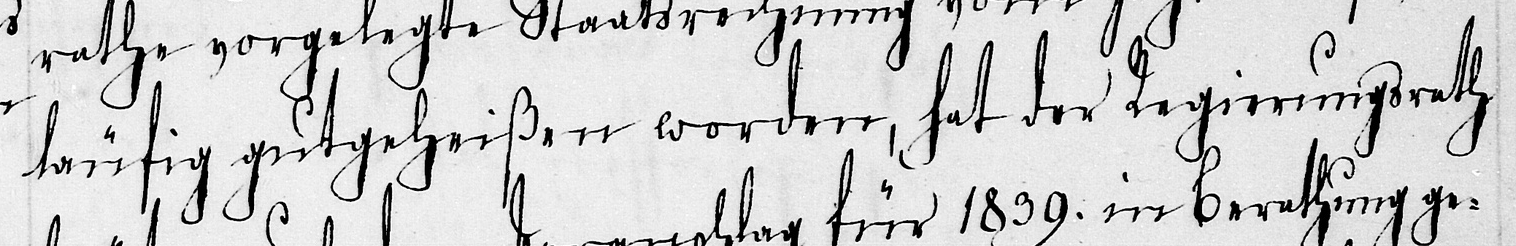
läufig gutgeheißen worden, hat der Regierungsrath
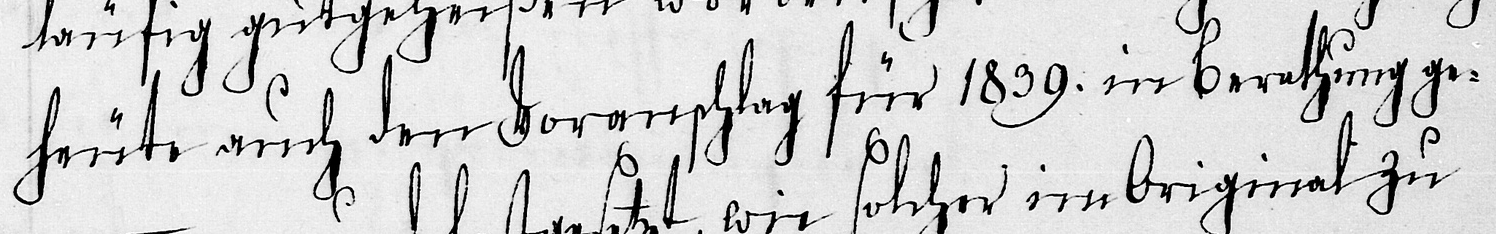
heute auch den Voranschlag für 1839. in Berathung ge¬
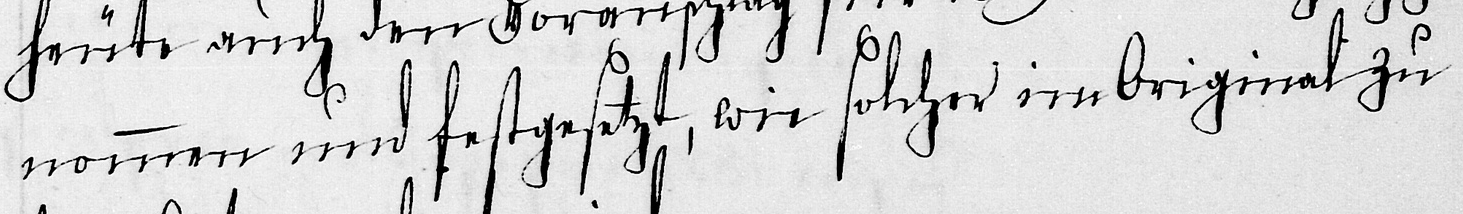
nommen und festgesetzt, wie solcher im Original zu
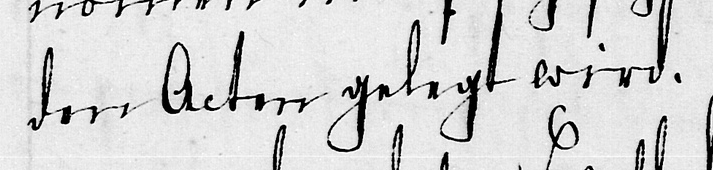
den Acten gelegt wird.
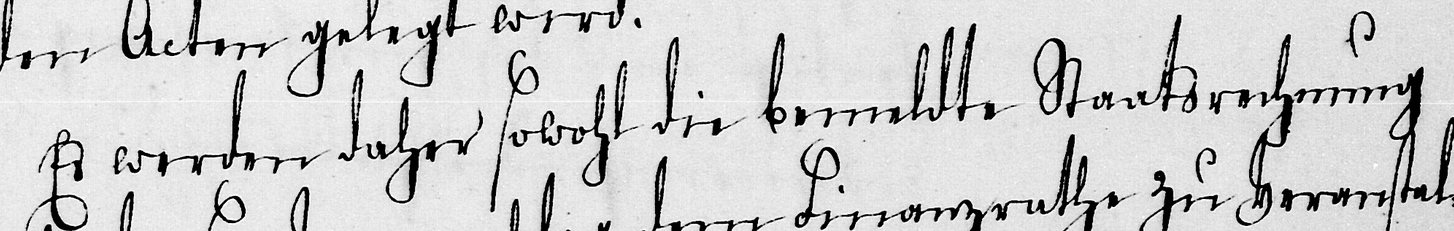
Es werden daher sowohl die bemeldte Staatsrechnung
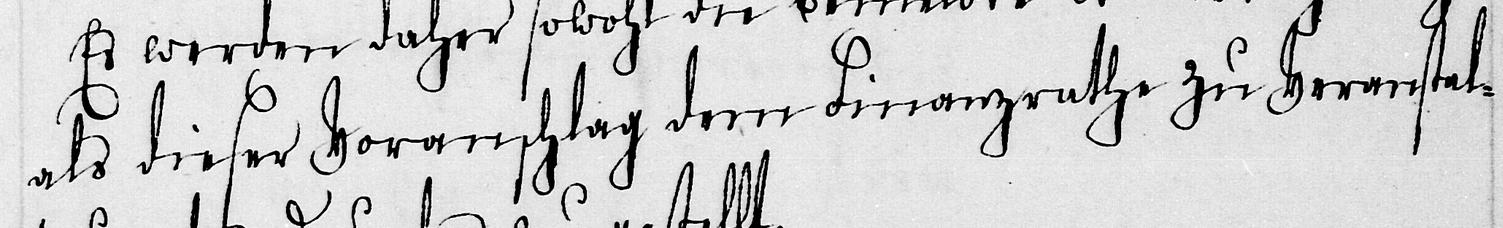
als dieser Voranschlag dem Finanzrathe zu Veranstal¬
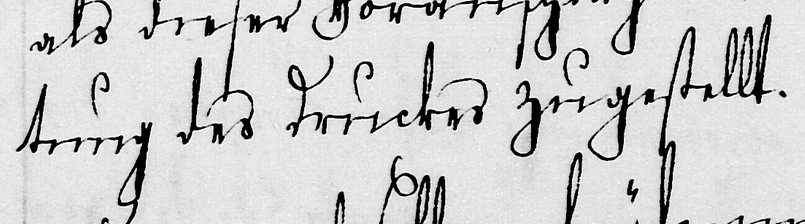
tung des Druckes zugestell¬
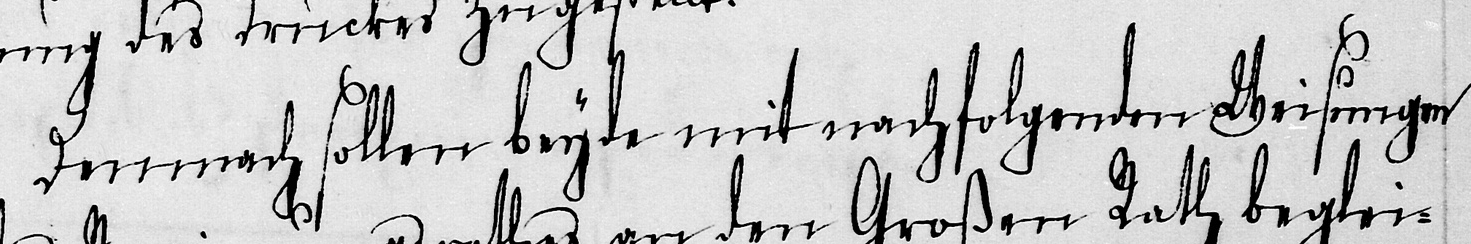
Demnach sollen beyde mit nachfolgenden Weisungen
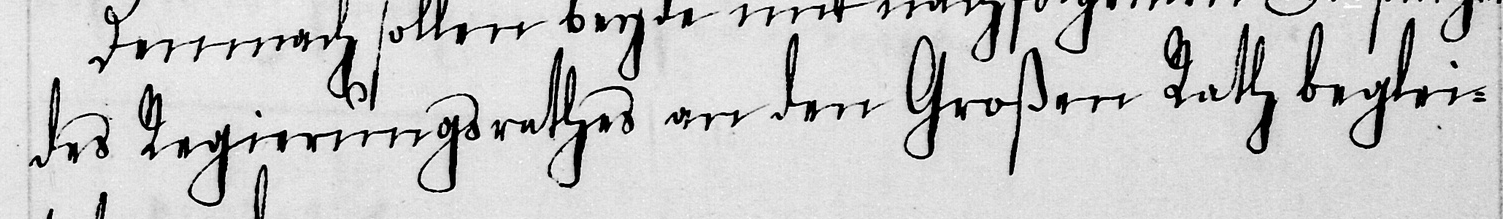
des Regierungsrathes an den Großen Rath beglei¬
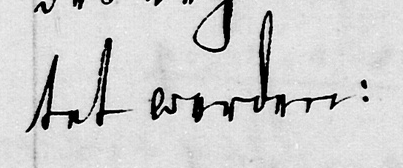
tet werden:
